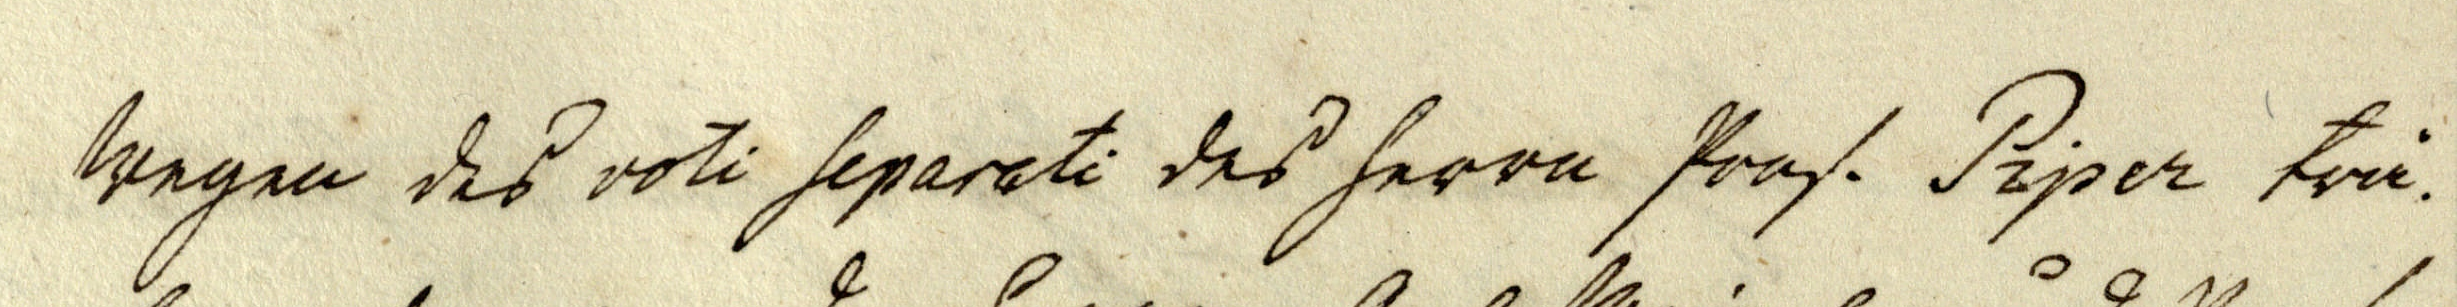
Wegen des voti separati des Herrn Prof. Piper trä¬
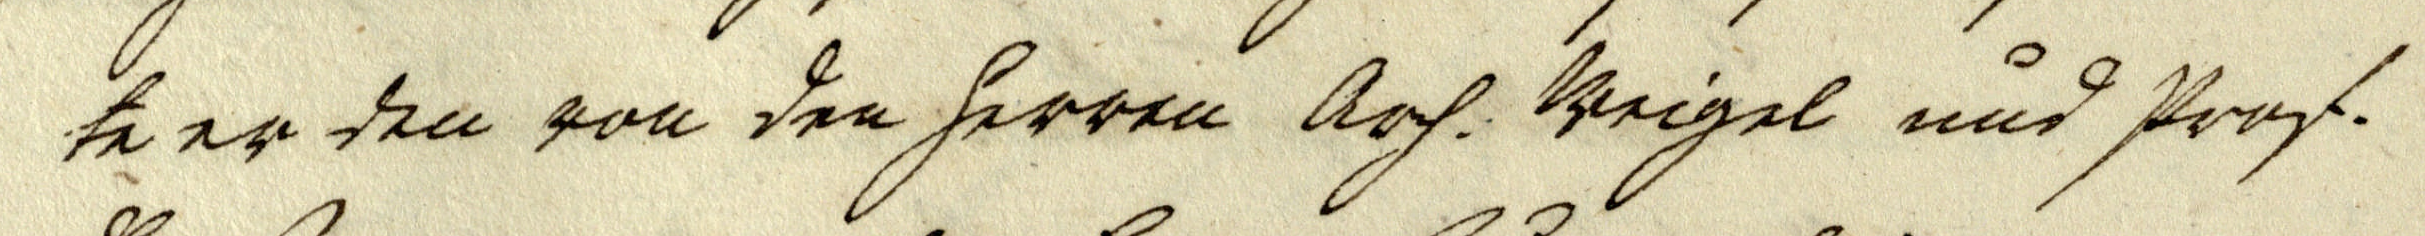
te er den von den Herren Arch. Weigel und Prof.
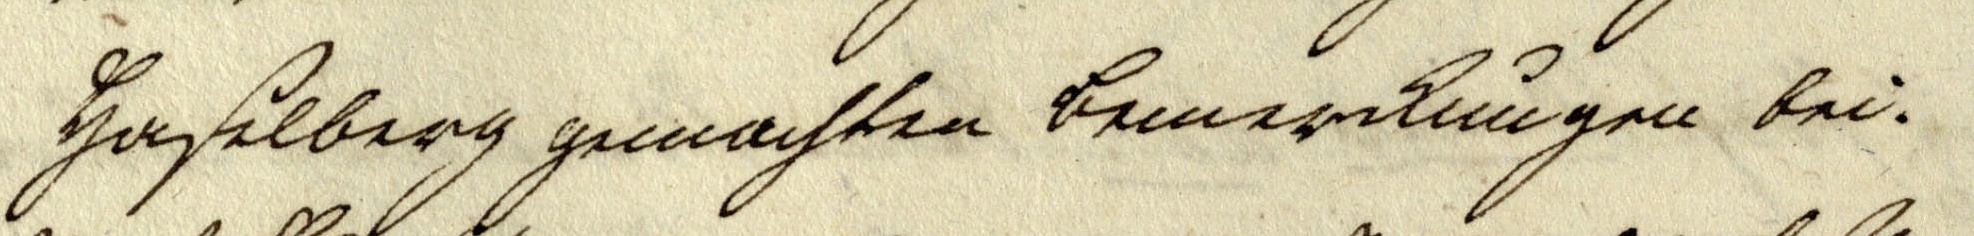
Haselberg gemachten Bemerckungen bei.
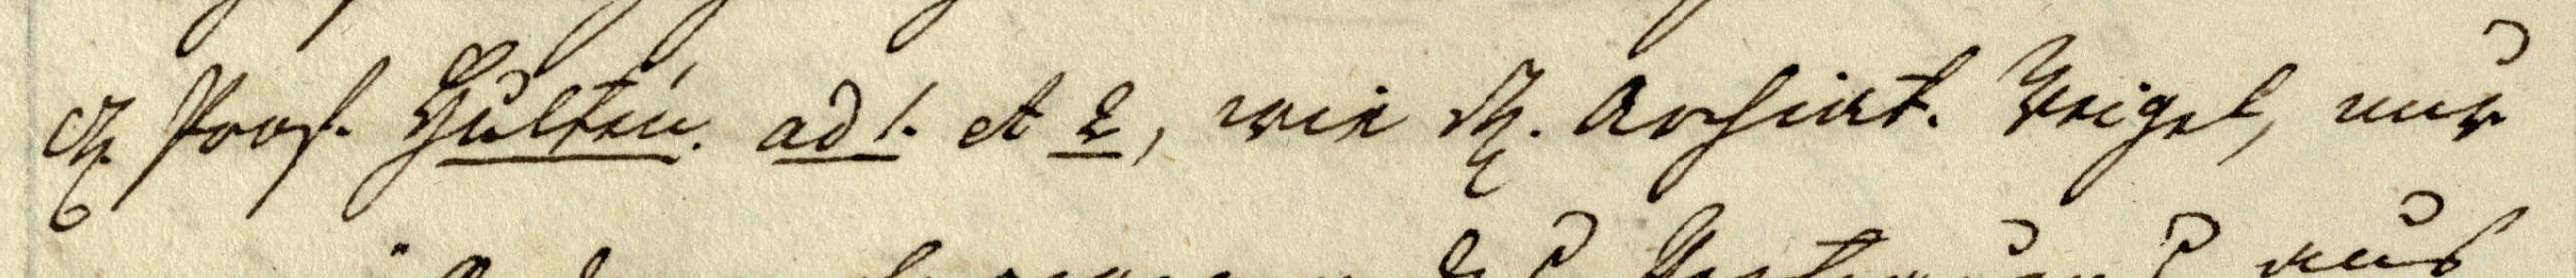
dh. Prof. Hultén. ad 1. et 2, wie dh. Archiat. Weigel, nur
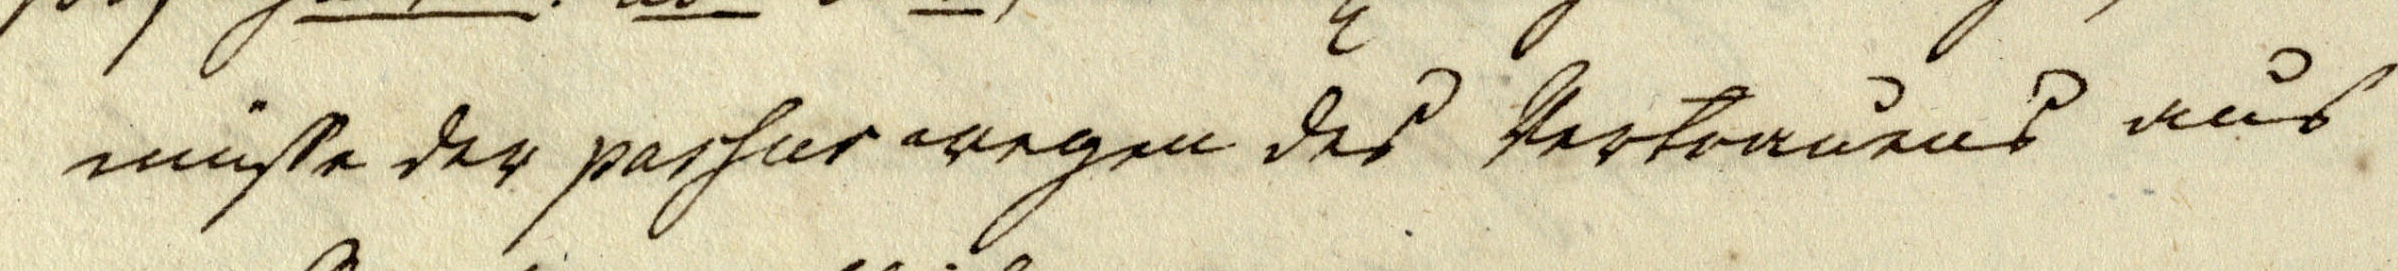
müsse der passus wegen des Vertrauens aus
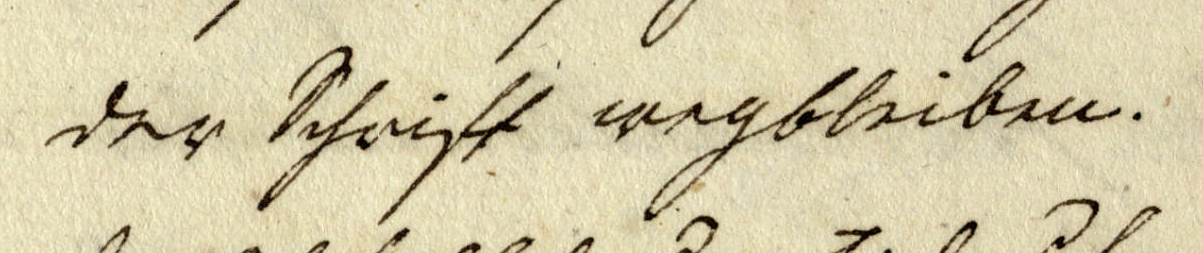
der Schrift wegbleiben.
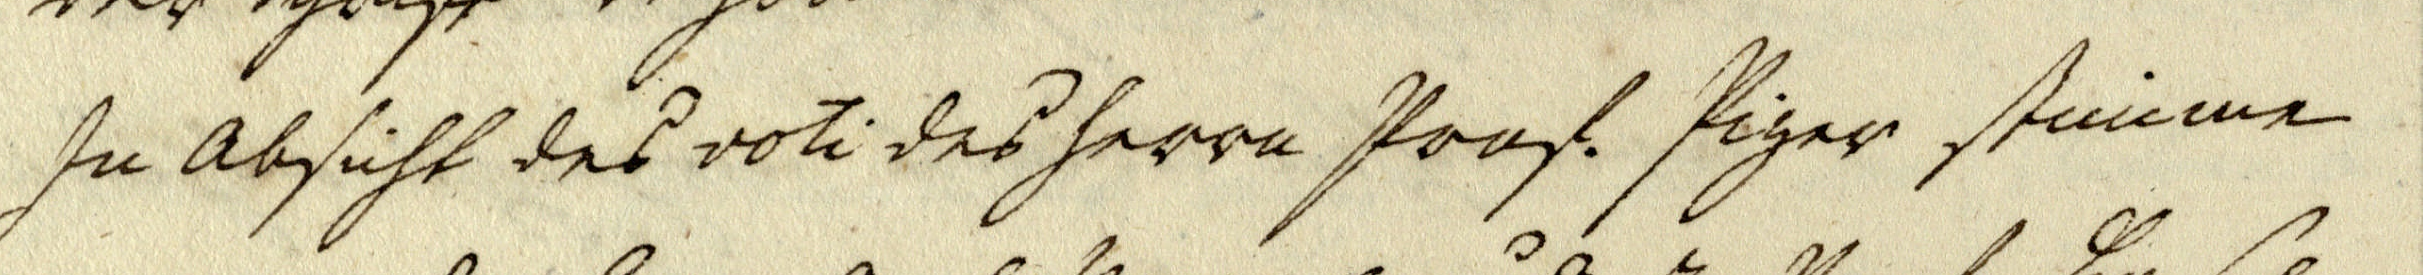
In Absicht des voti des Herrn Prof. Piper stimme
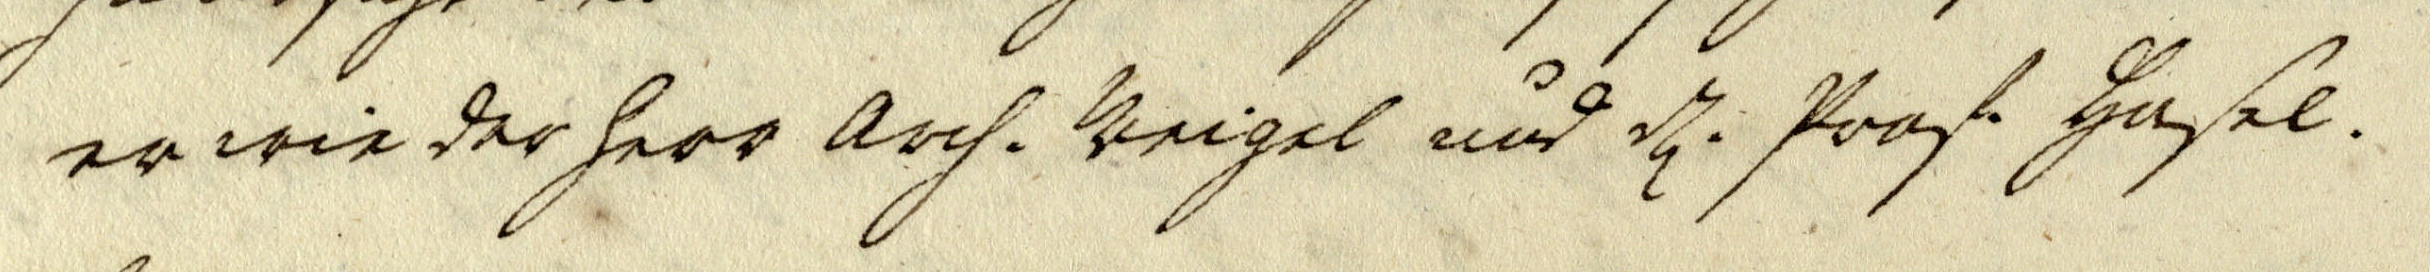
er wie der Herr Arch. Weigel und dh. Prof. Hasel¬
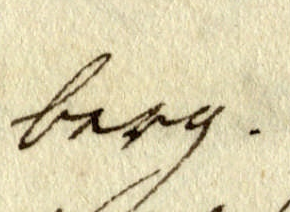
berg.
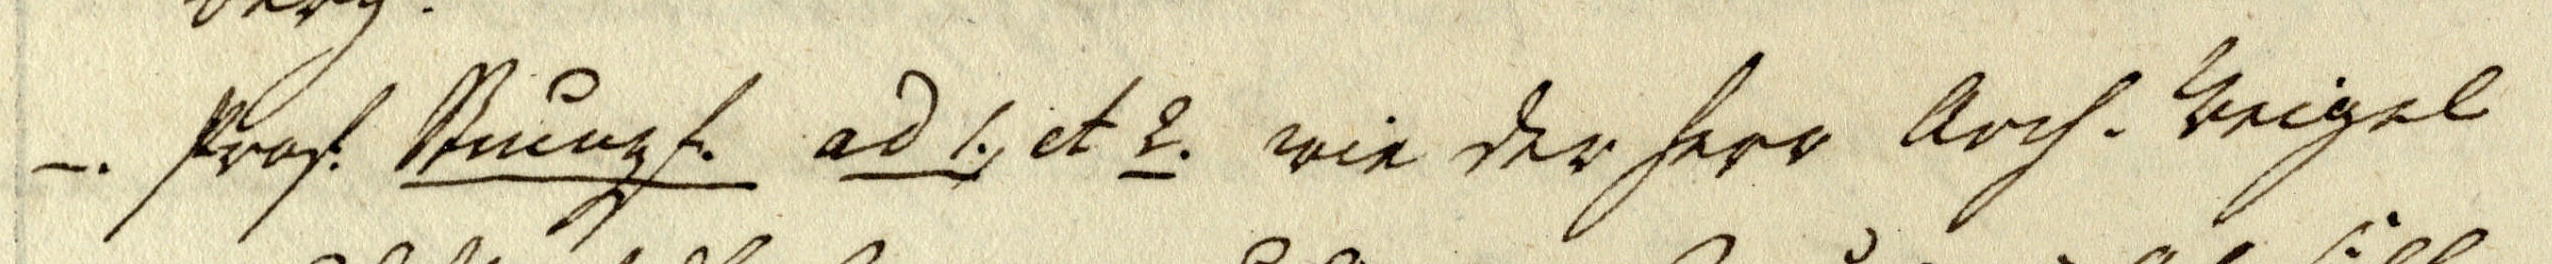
Prof. Stumpf. ad 1., et 2. wie der Herr Arch. Weigel
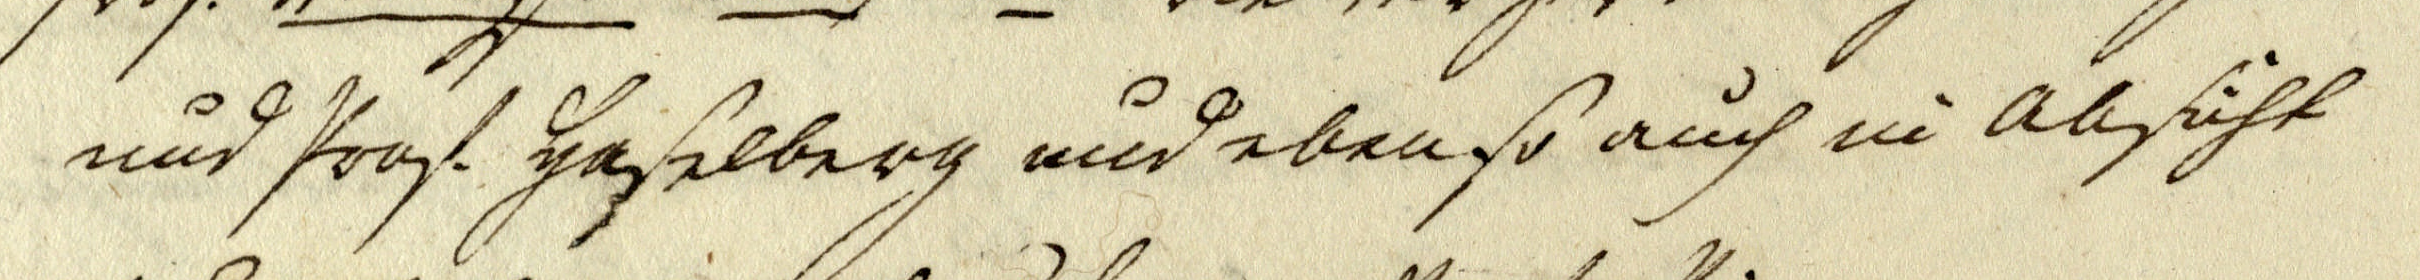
und Prof. Haselberg und ebenso auch in Absicht
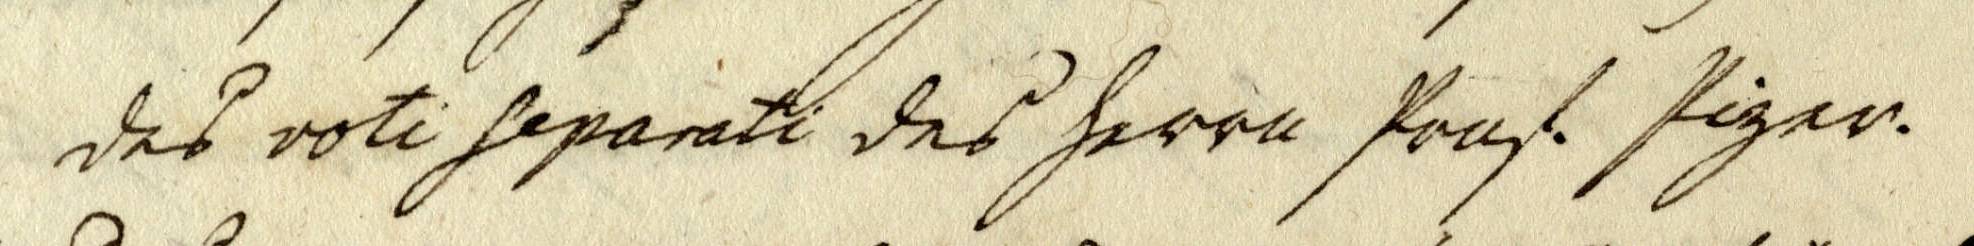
des voti separati des Herrn Prof. Piper.
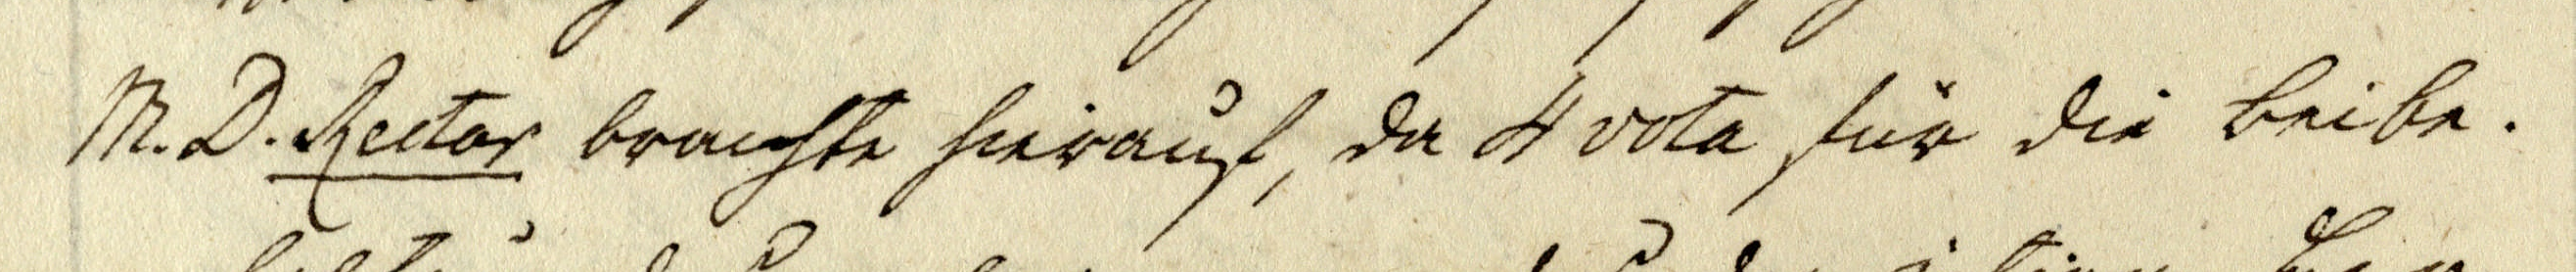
M. D. Rector brachte hierauf, da 4 vota für die Beibe¬
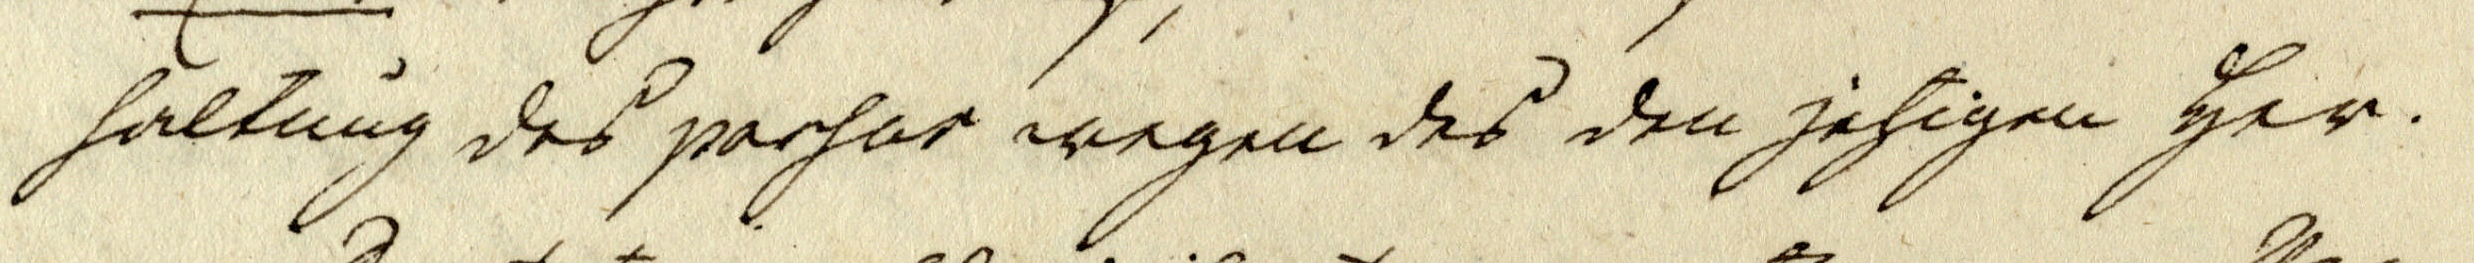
haltung des passus wegen des den jetzigen Her¬
